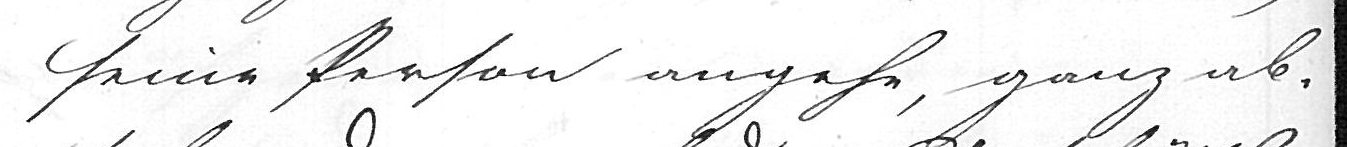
seine Person angehe, ganz ab-
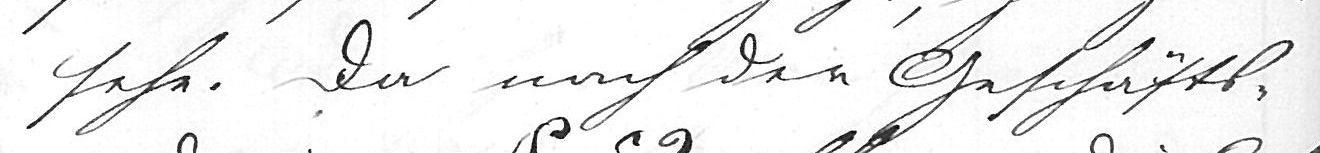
sehe. Da nach der Geschäfts-
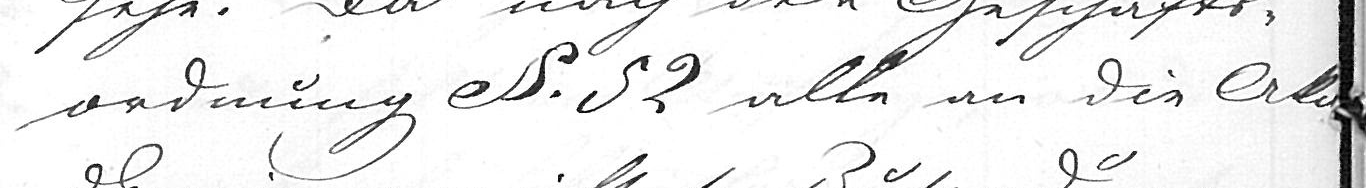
ordnung §. 52 als in die Aka-
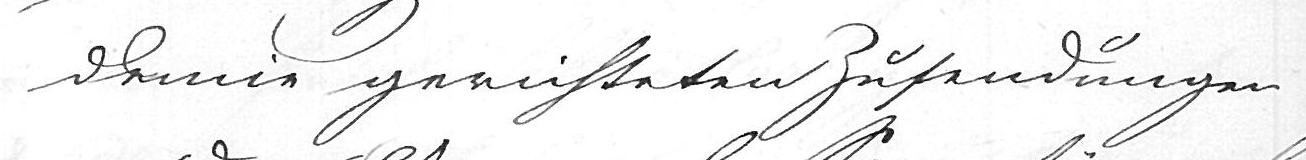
demie gerichteten Zusendungen
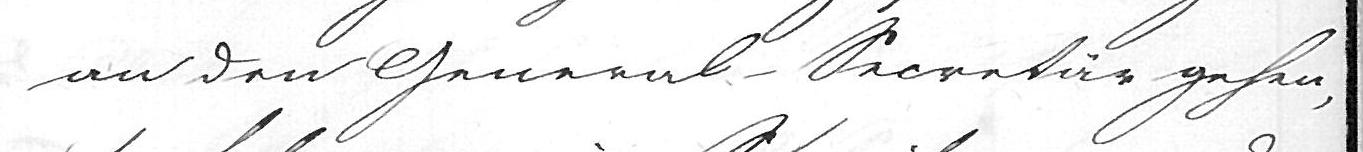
an den General-Secretär gehen,
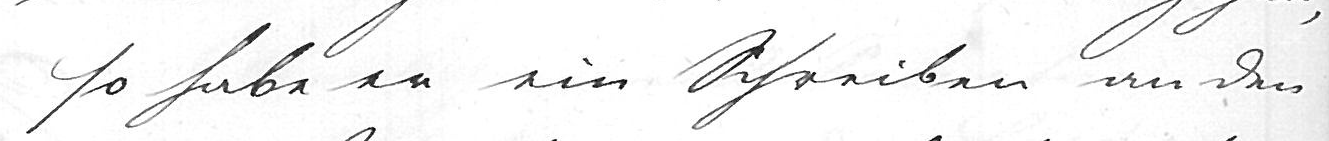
so habe er ein Schreiben an den
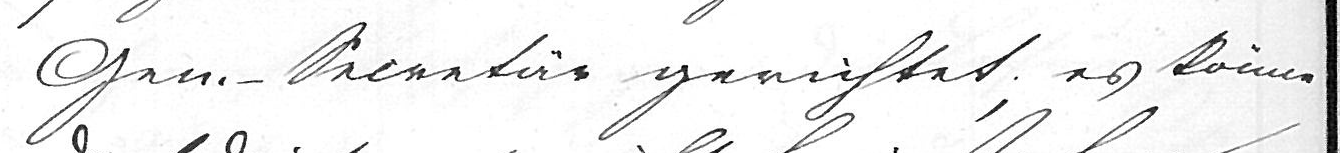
Gen.-Secretär gerichtet; es könne
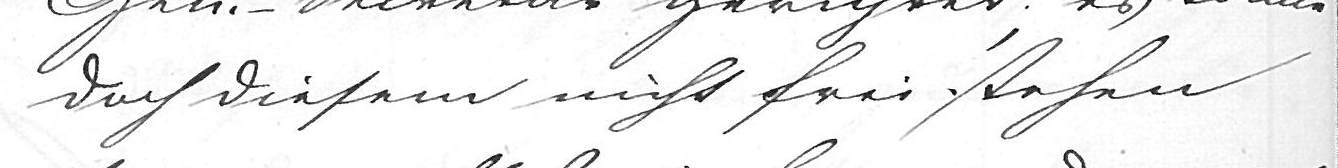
doch diesem nicht freistehen
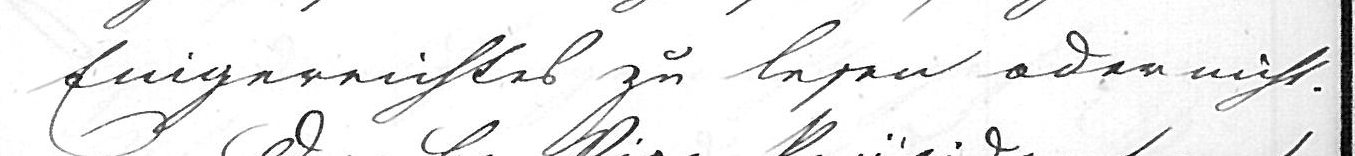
Eingereichtes zu lesen oder nicht.
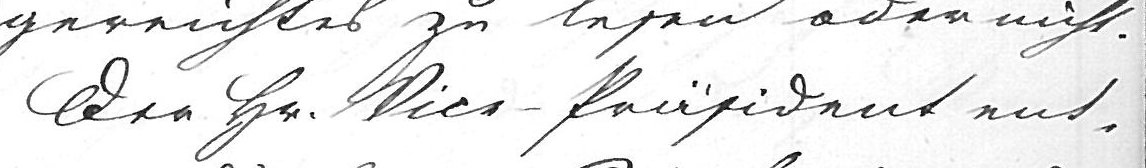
Der Hr. Vice-Präsident ent-
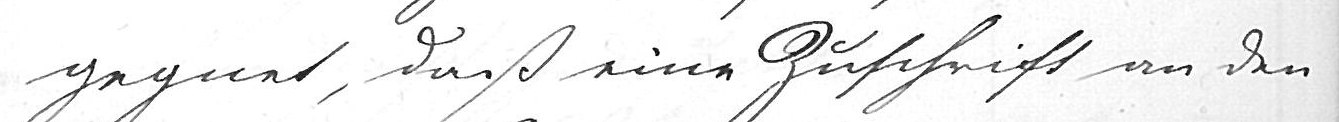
gegnet, daß eine Zuschrift an den
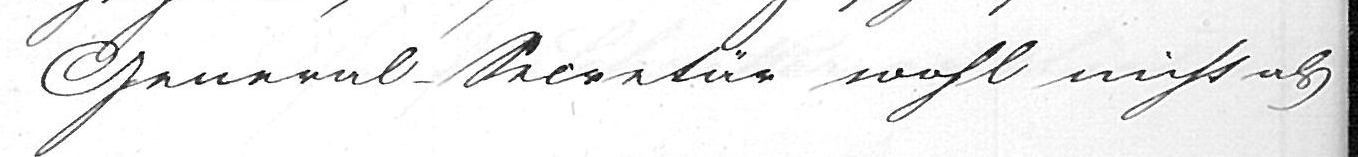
General-Secretär wohl nicht als
